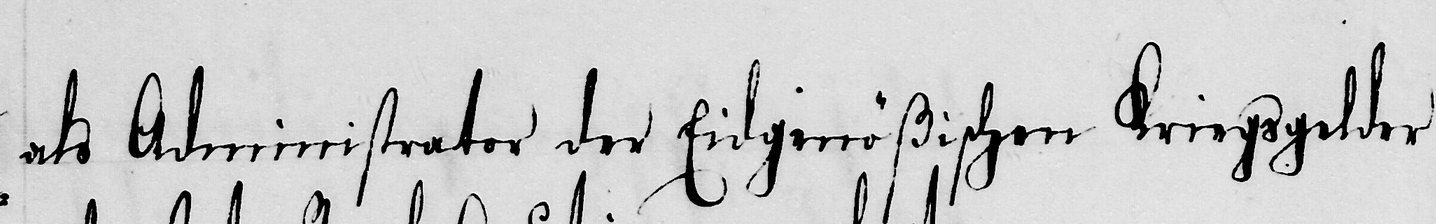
als Administrator der Eidgenößischen Kriegsgelder
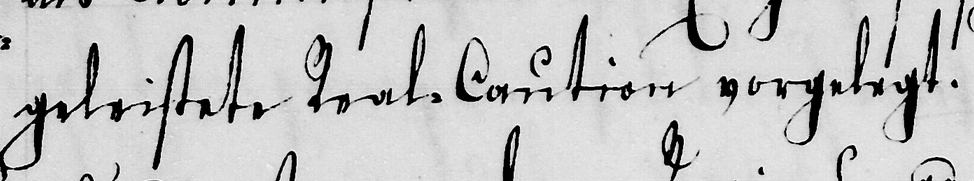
geleistete Real-Caution vorgelegt.
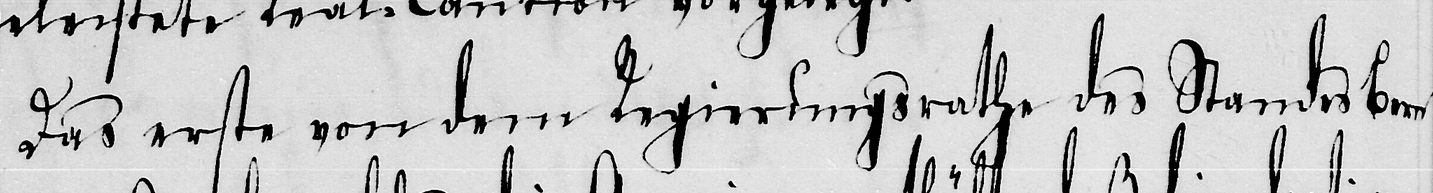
Das erste von dem Regierungsrathe des Standes Be¬
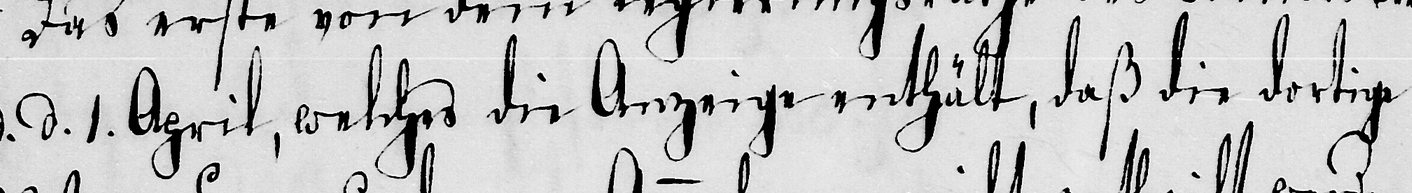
1. April, welches die Anzeige enthält, daß die dortige
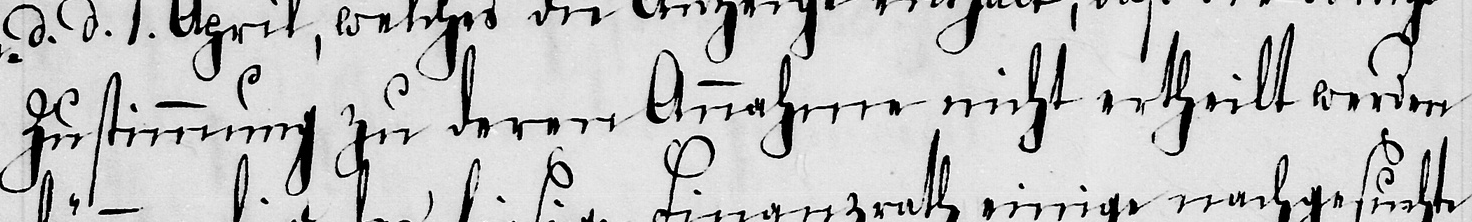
Zustimmung zu deren Annahme nicht ertheilt werden
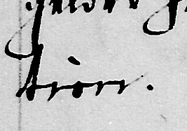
ein¬
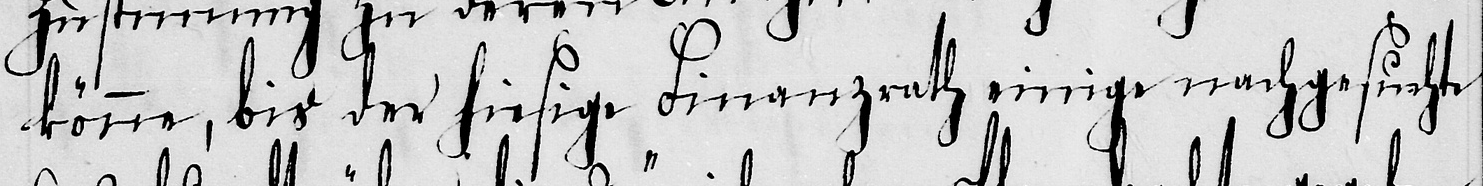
könne, bis der hiesige Finanzrath einige nachgesuchte
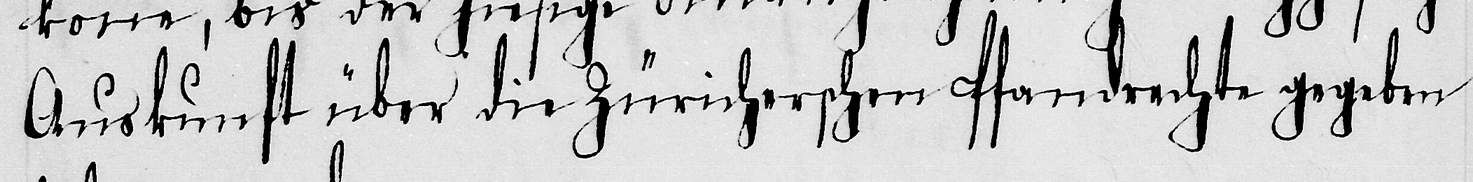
Auskunft über die Zürcherischen Pfandrechte gegeben
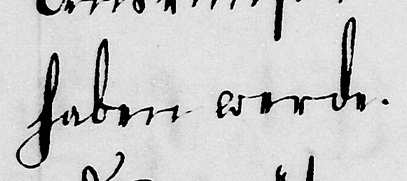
haben werde.
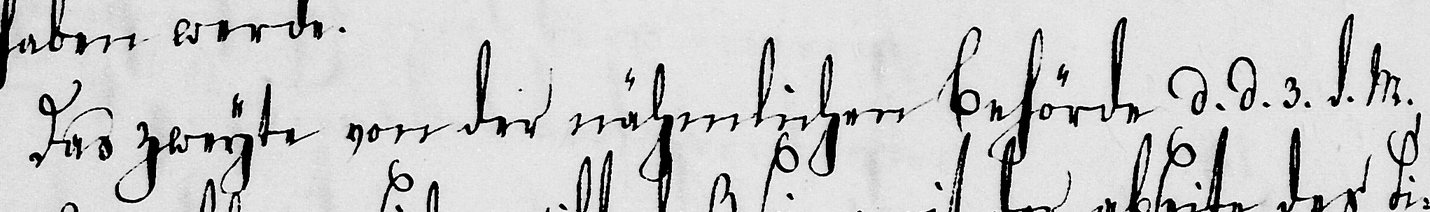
Das zweyte von der nähmlichen Behörde d. d. 3. d.
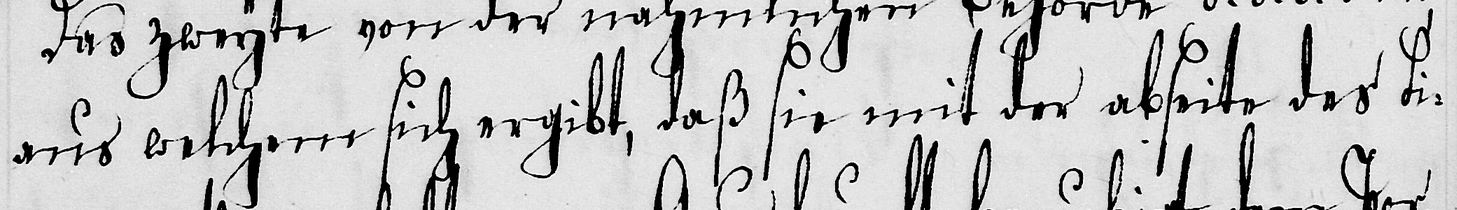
aus welchem sich ergibt, daß sie mit der abseite des Fi¬
